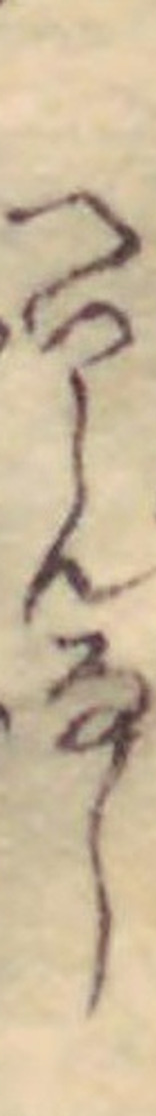へいしんなし
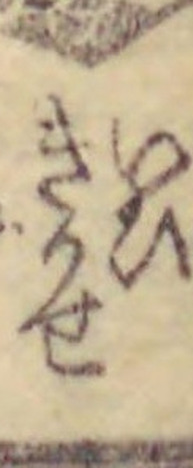きかせ
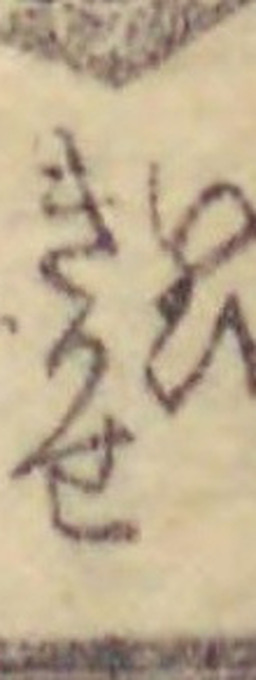きかせ
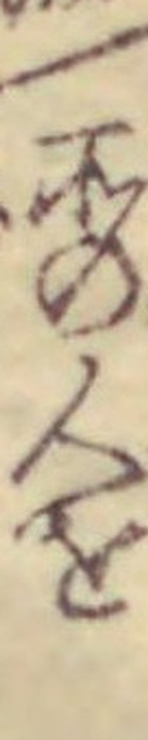所の人を
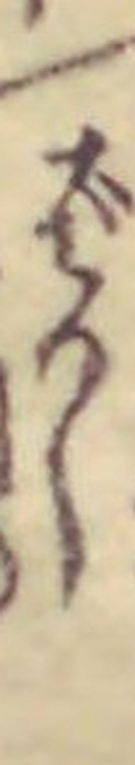ばかし
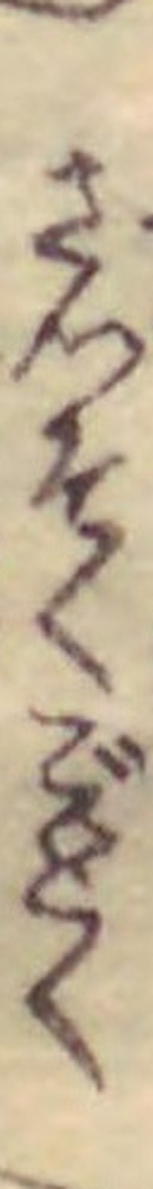さつそくごとく
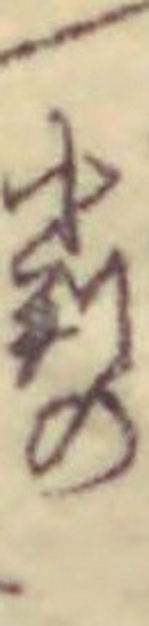小判の
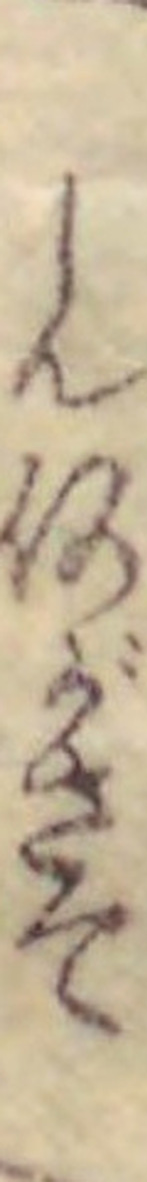しん何がさて
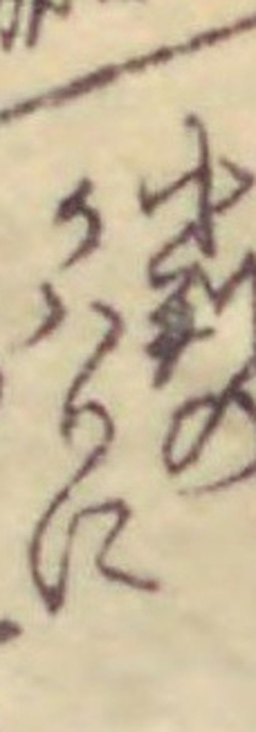かはりに
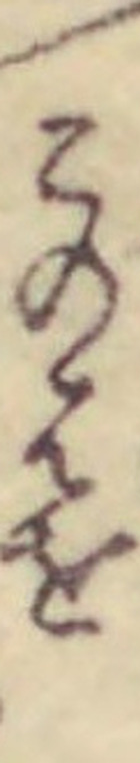このはを
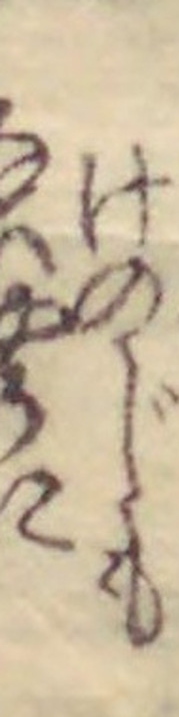けのじも
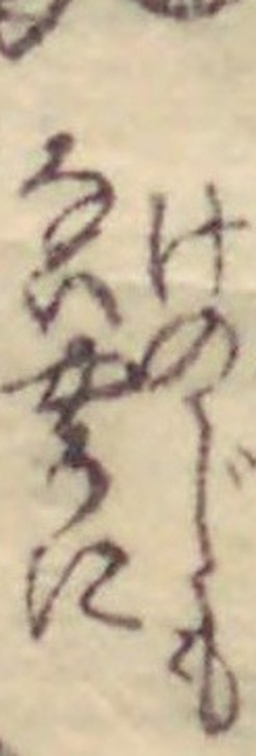ないやうに
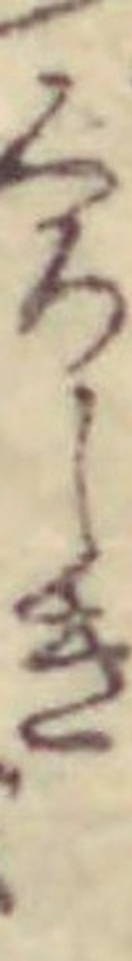くろしき
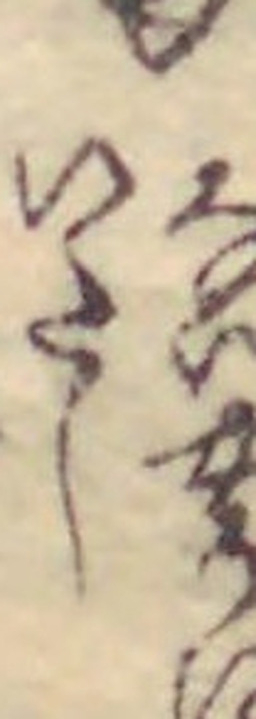いたし
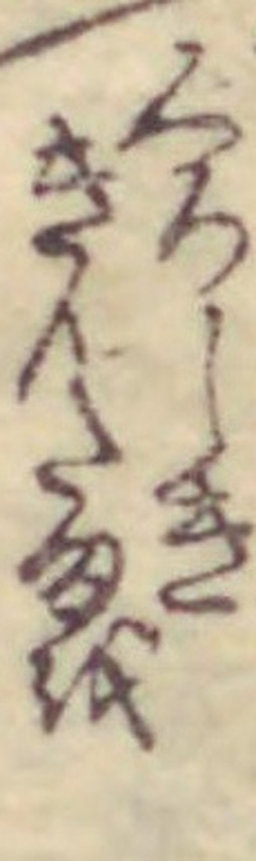きんたまを
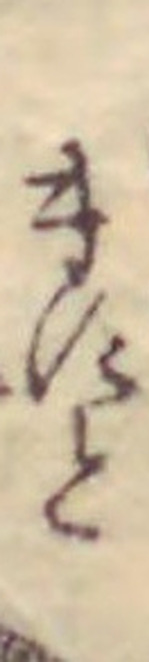ますと
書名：化物世帯氣質
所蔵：国立国会図書館 National Diet Library, JAPAN
